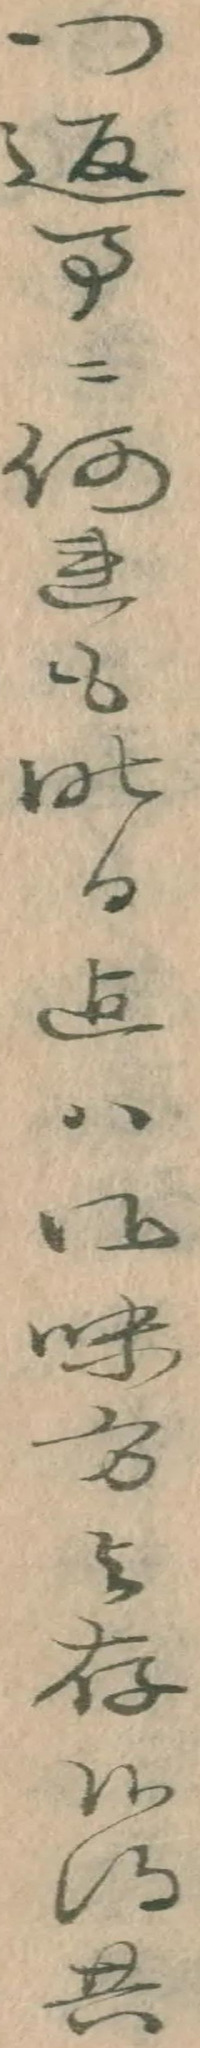門返事に何れも昨日迄は御味方与存候得共
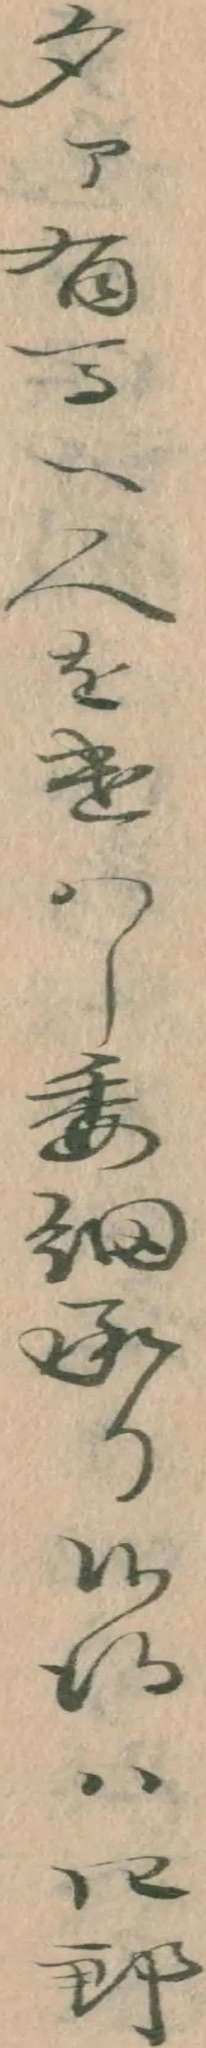夕部有馬へ人を遣はし委細承り候得は四郎
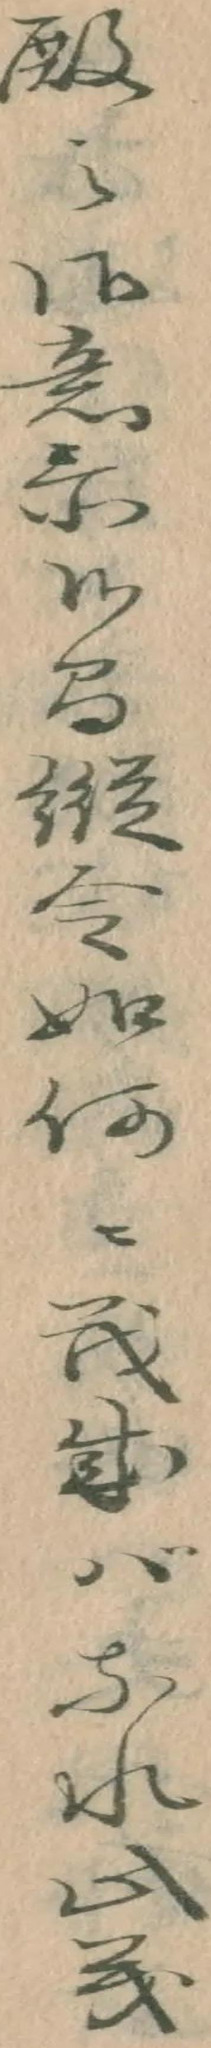殿之御意示候間縦令如何にも成ばなれ此義
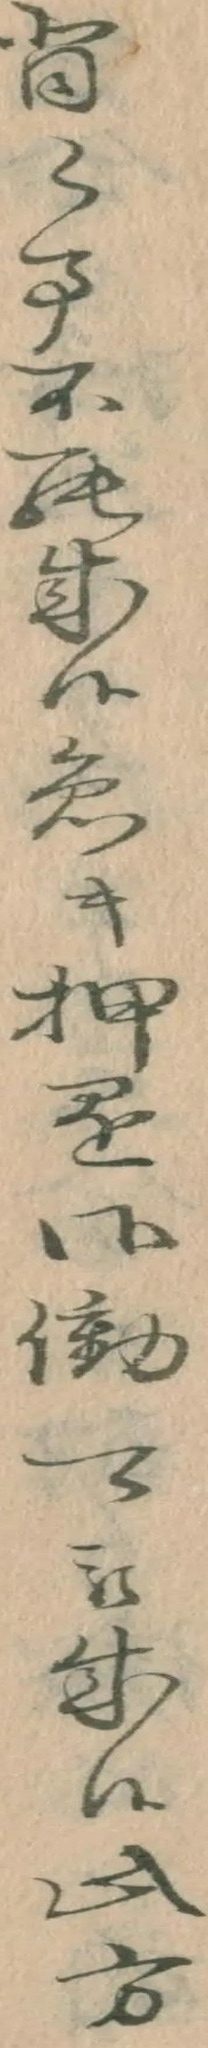背く事不能成候急き押懸御働可被成候此方
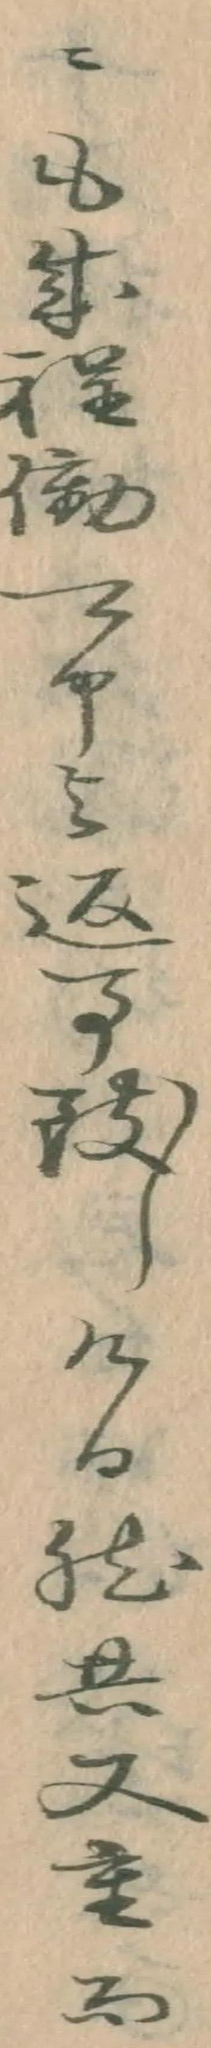にも成程働可申与返事致ける然共又重而
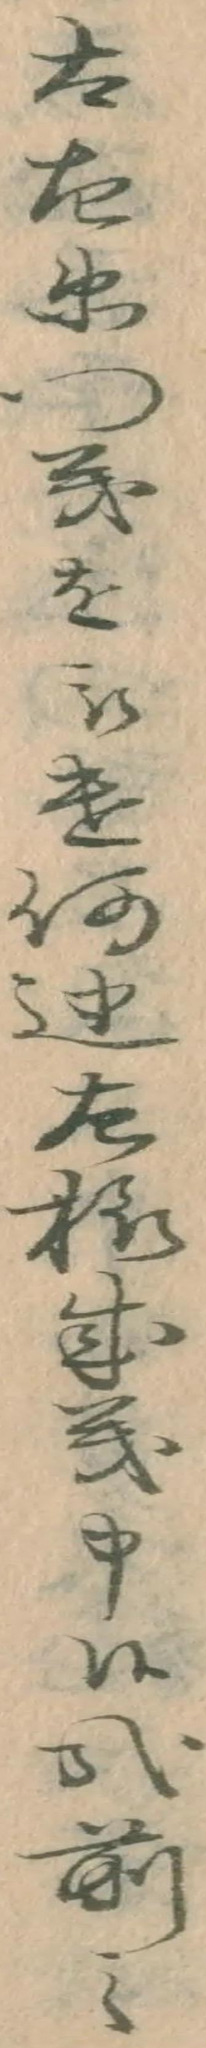太左衛門義を被遣何迚左様成義申候哉前之

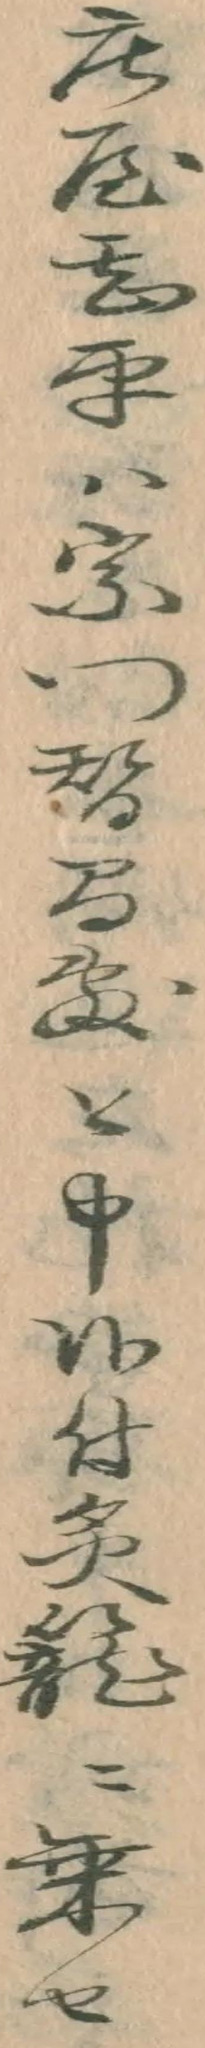庄屋甚平は宗門替間敷と申候付炙籠に乗せ
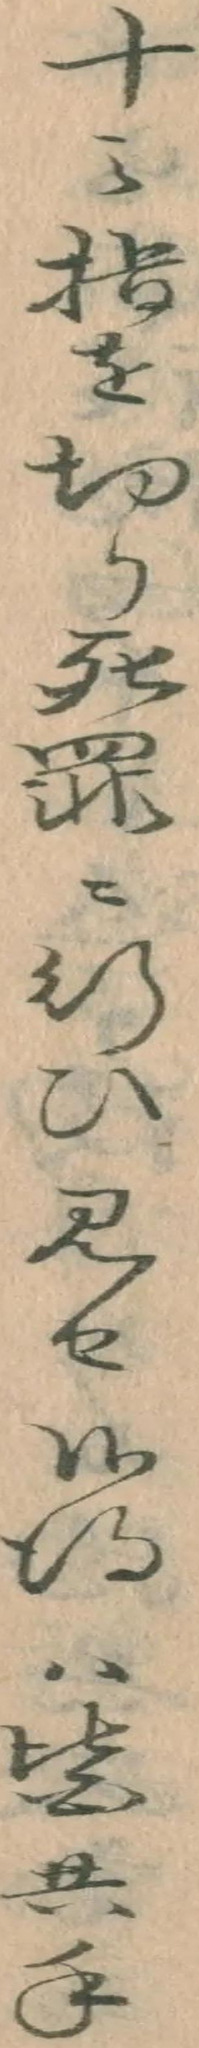十之指を切り死罪に行ひ見せ候得は皆共手
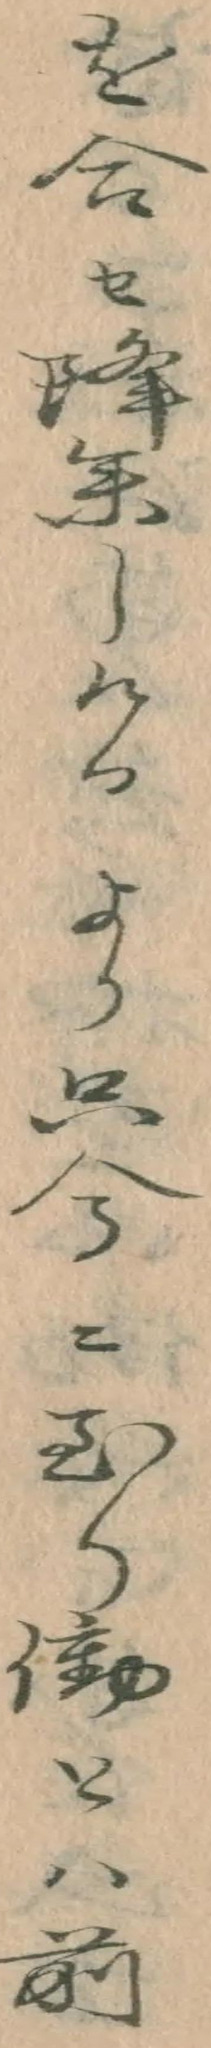を合せ降参しけるより只今に至り働とは前
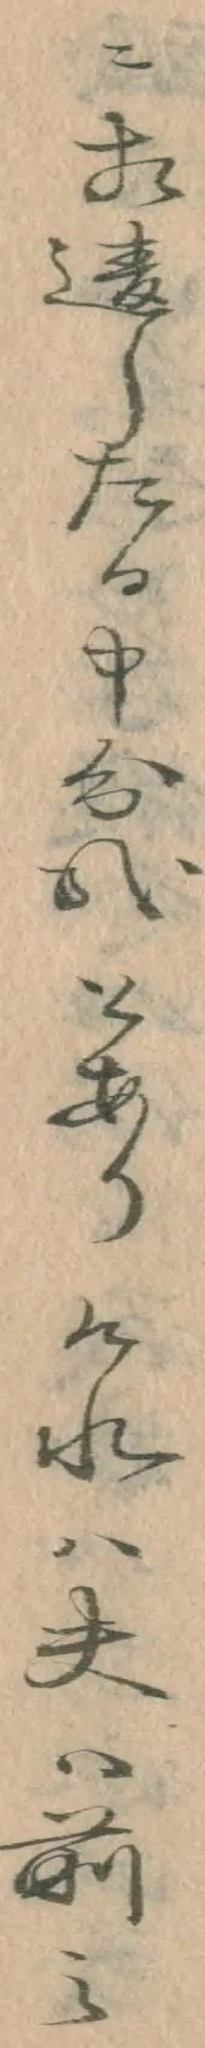に相違したる申分哉とありけれは夫は前之
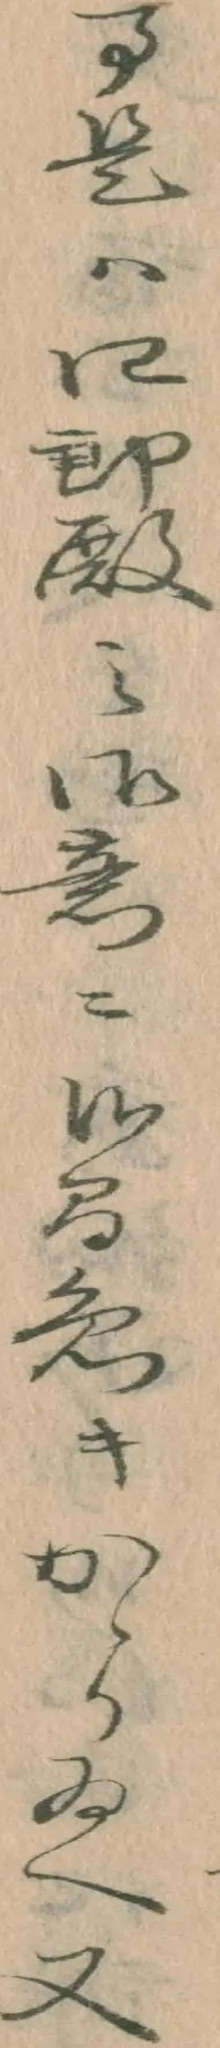事是は四郎殿之御意に候間急きかゝり給へ又
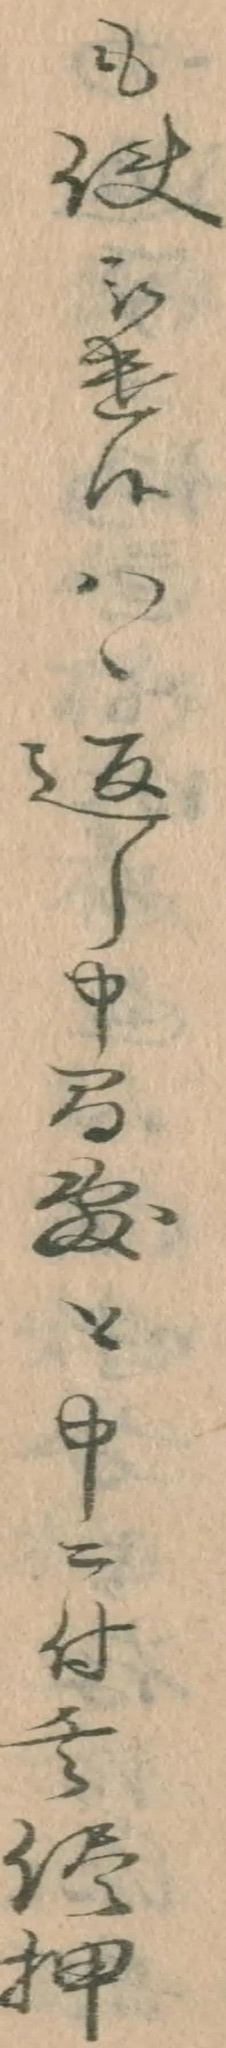も使被遣候はゝ返し申間敷と申に付其侭押
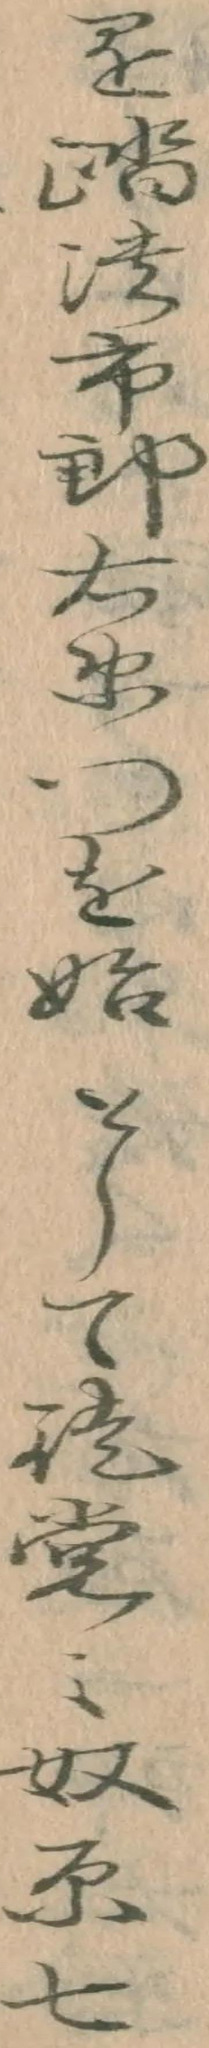懸踏潰市郎右衛門を始として徒党之奴原七
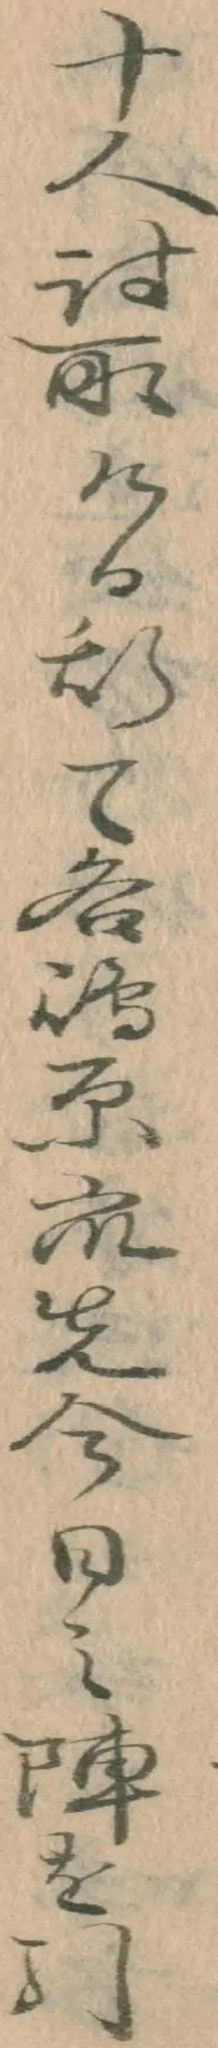十人討取ける斯て各島原衆先今日之陣を引
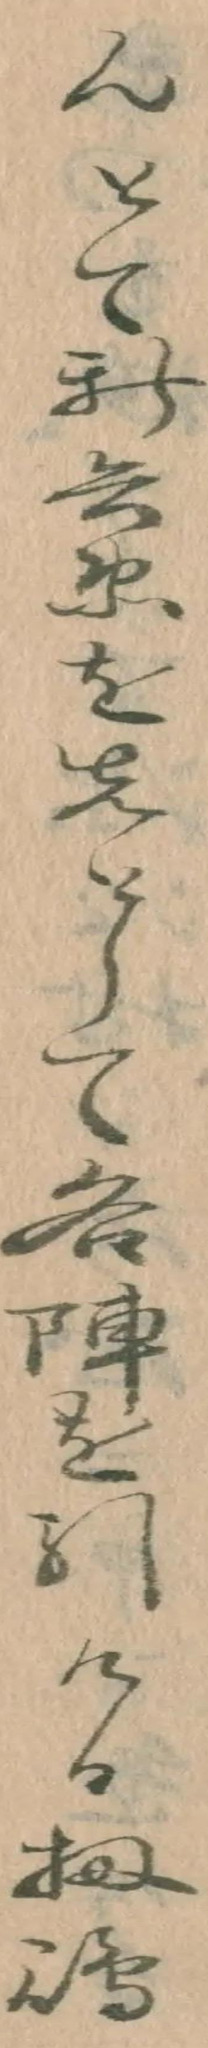んとて新兵衛を先として各陣を引ける扨島
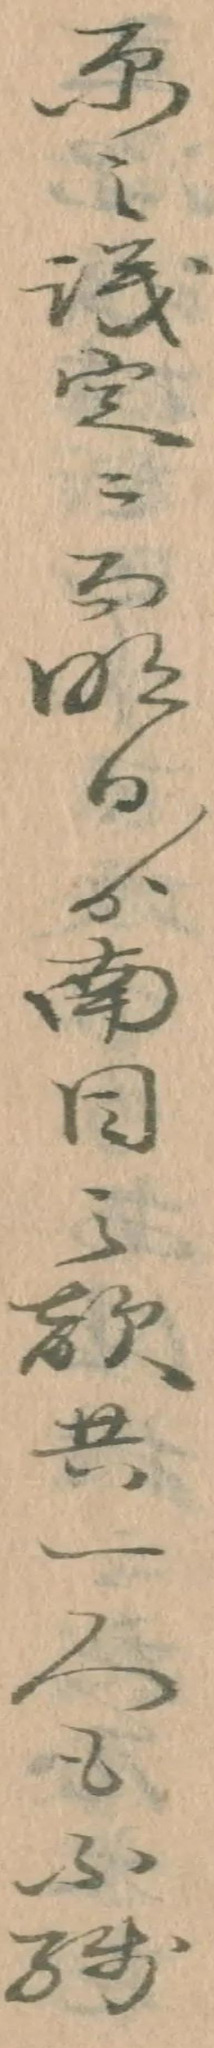原之議定に而明日ゟ南目之敵共一人も不残
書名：切支丹御退治記 49巻. [1]
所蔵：国立国会図書館 National Diet Library, JAPAN
